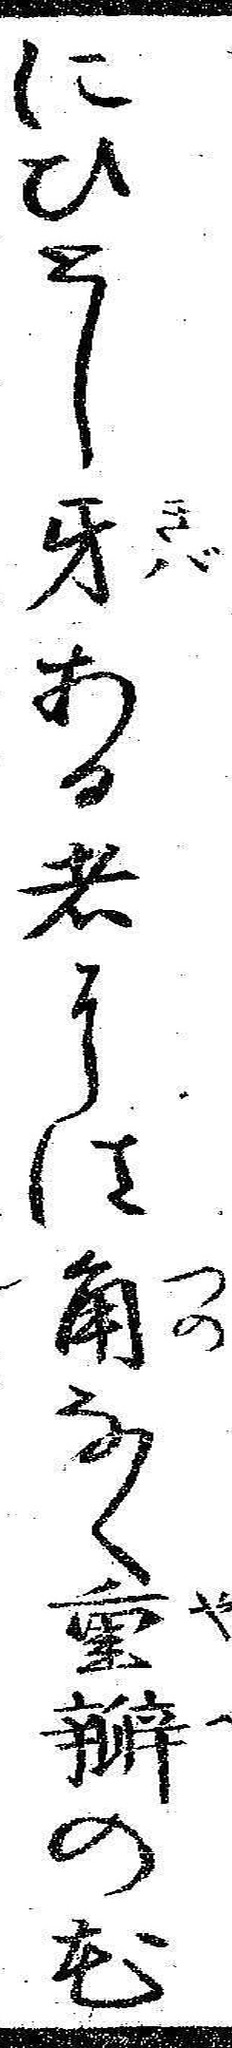にひとし牙ある者には角なく重弁の花
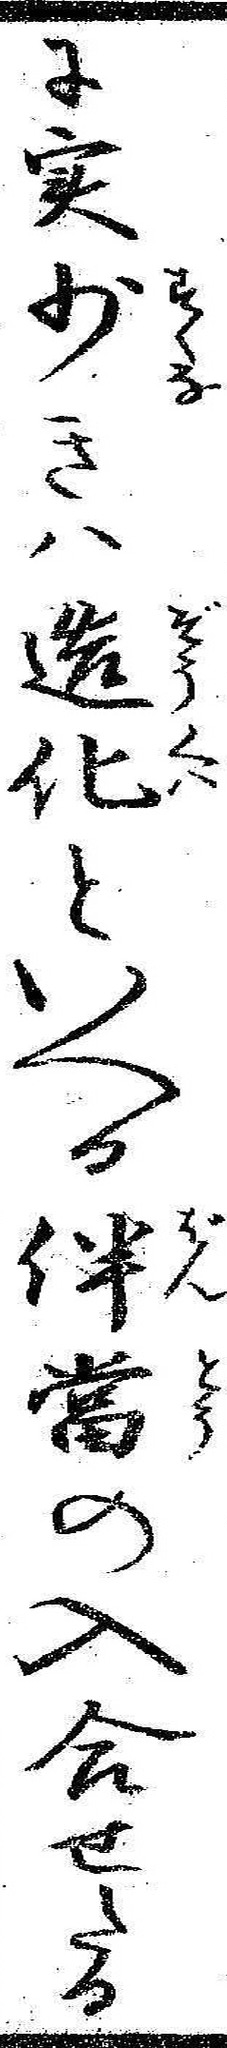に実少きは造化といへる伴当の入合せたる

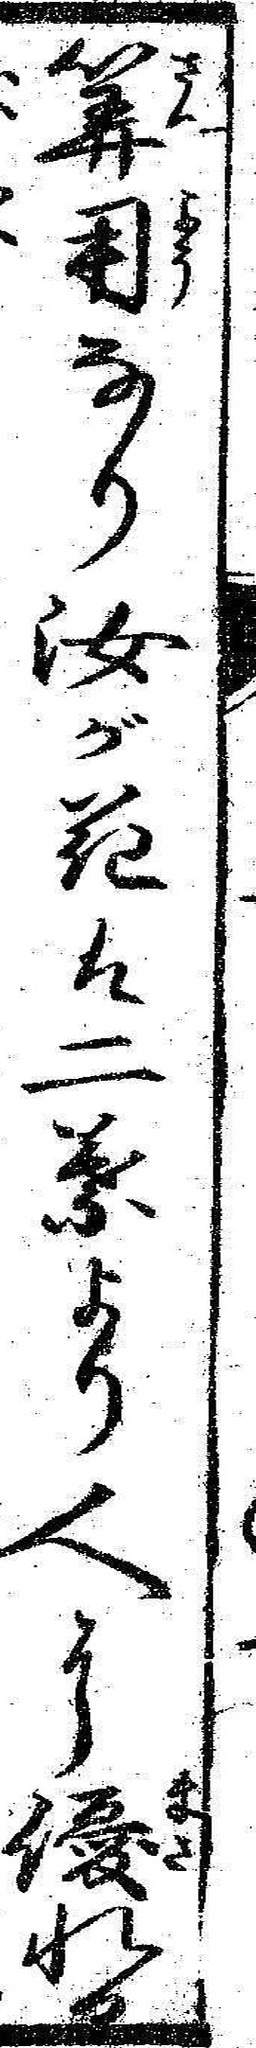算用なり汝が花は二葉より人に優れる
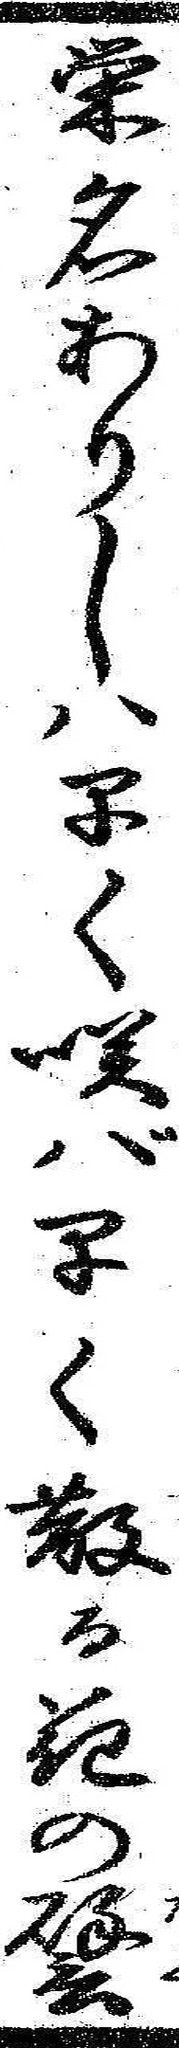栄名ありしは早く咲ば早く散る花の譬
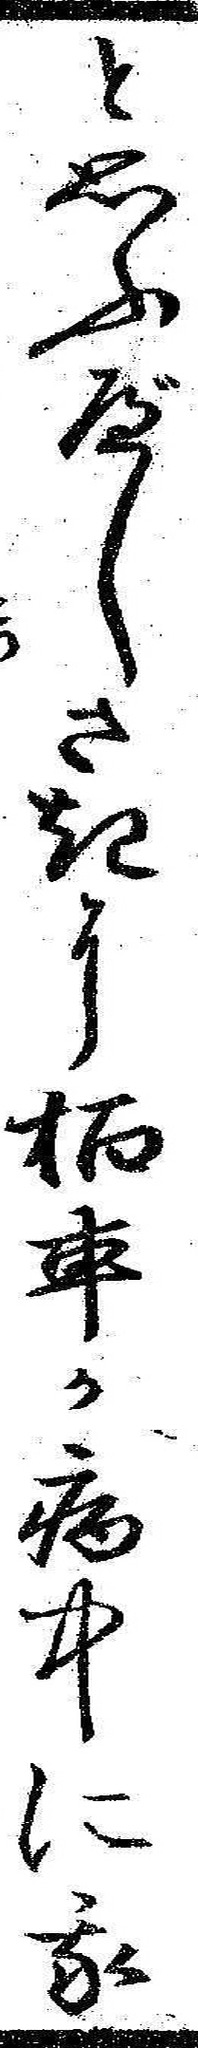と思ふべしさきに栢車か病中に我
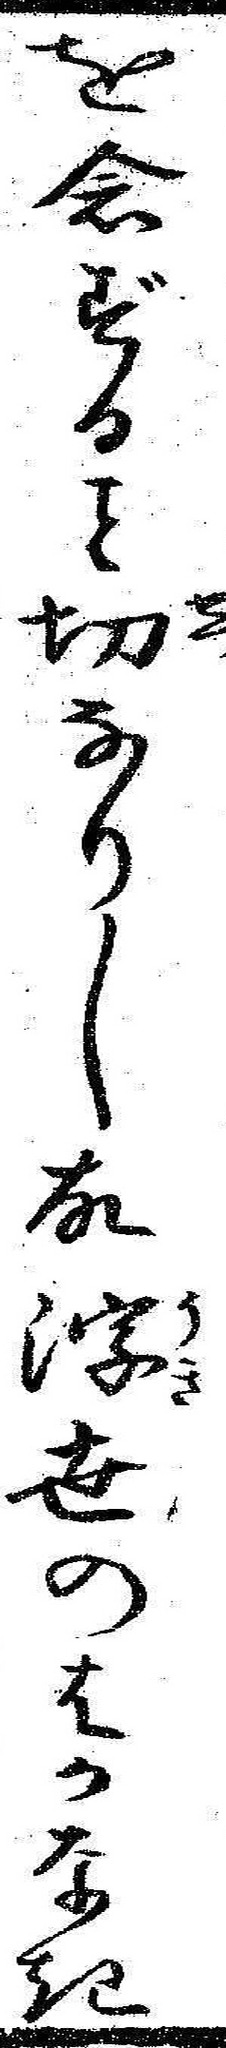を念ずること切なりし故浮世のはかなき
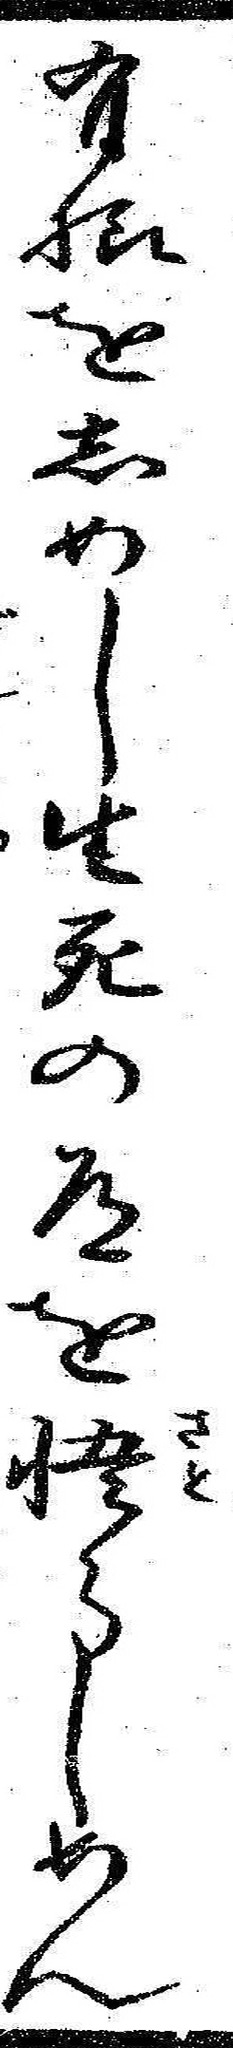有様をしめし生死の道を悟らしめん
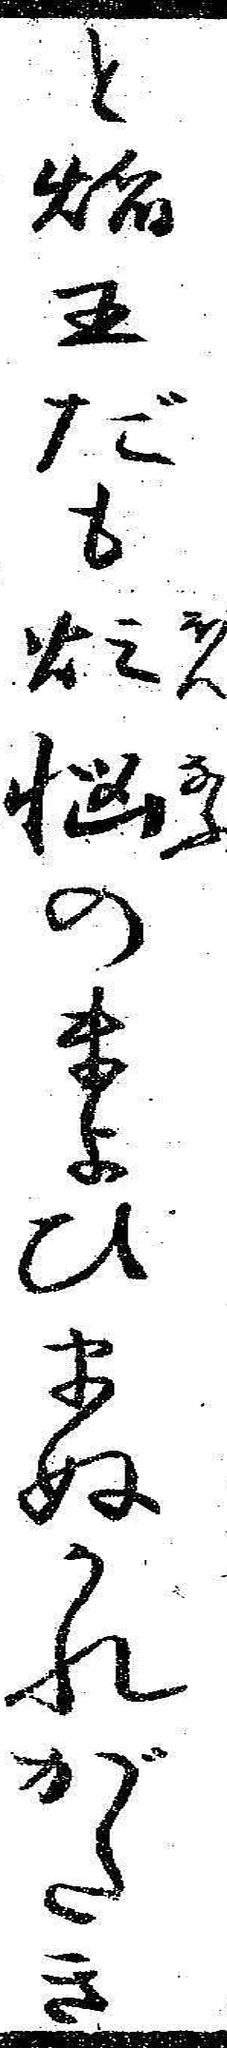と焔王だも煩悩のまよひまぬかれがたき
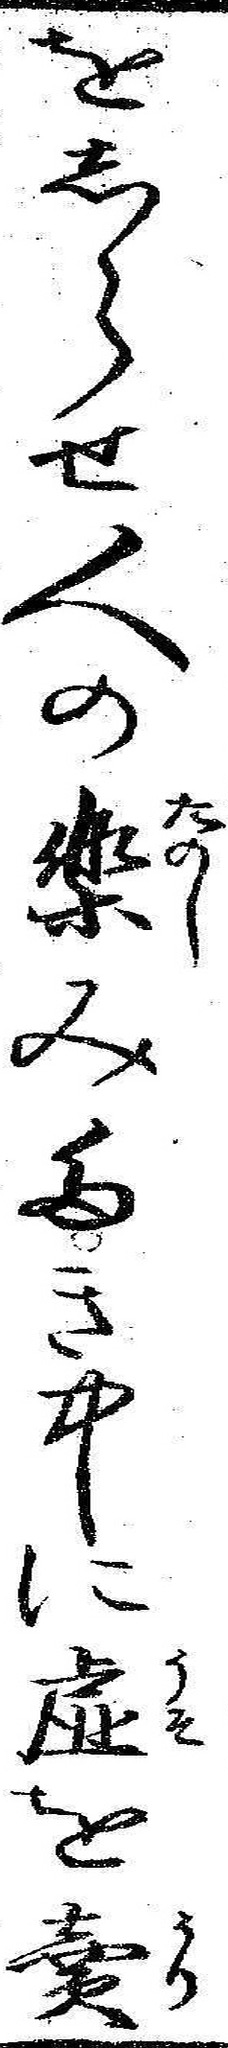をしらせ人の楽み多き中に虚を売
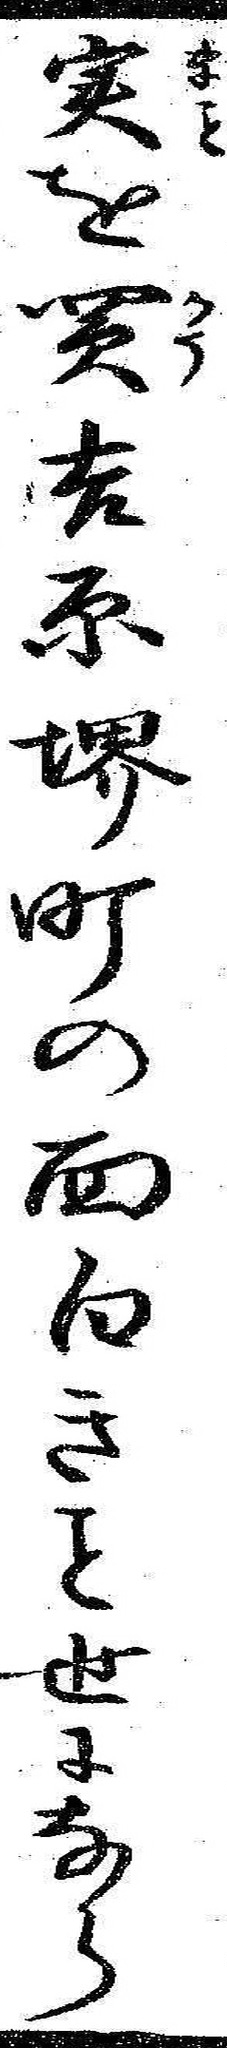実を買吉原堺町の面白きこと世になら
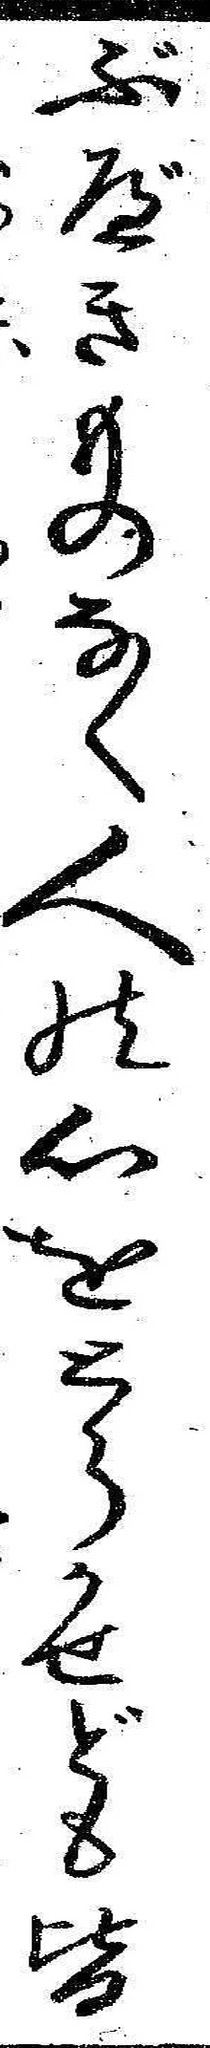ぶべきものなく人の心をとろかせども皆
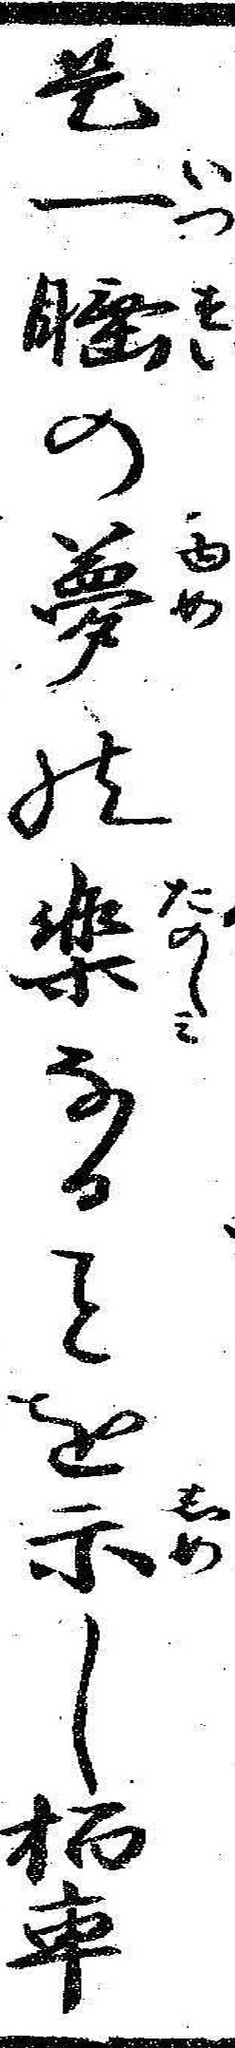是一睡の夢の楽なることを示し栢車
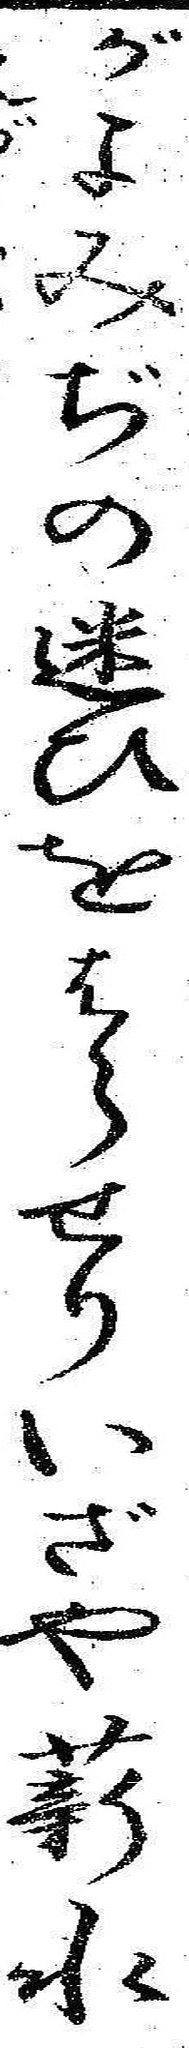がよみぢの迷ひをはらせりいざや薪水
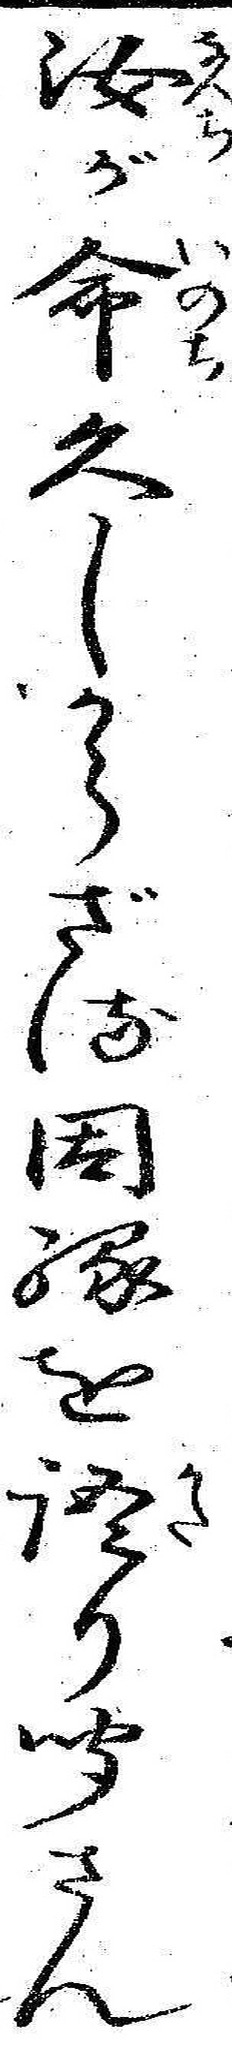汝が命久しからざる因縁を語り聞さん
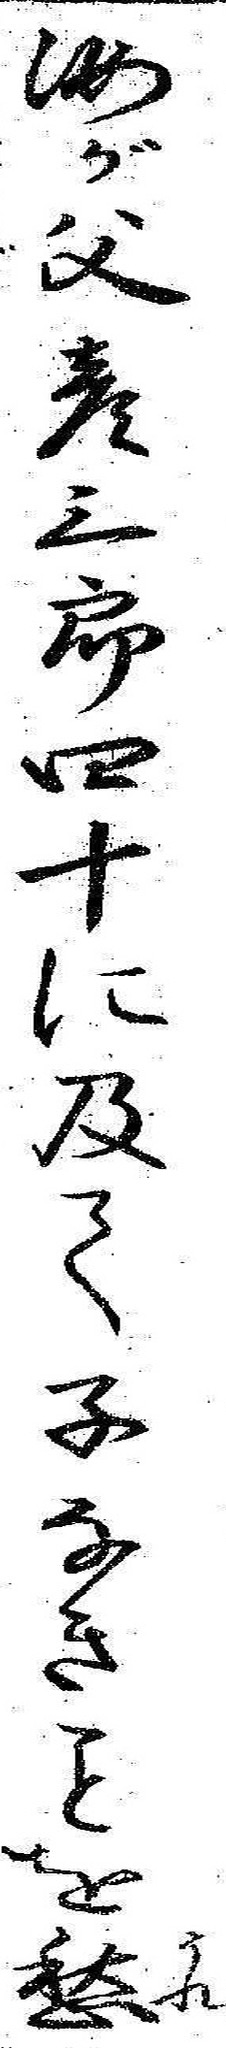汝が父彦三郎四十に及て子なきことを愁
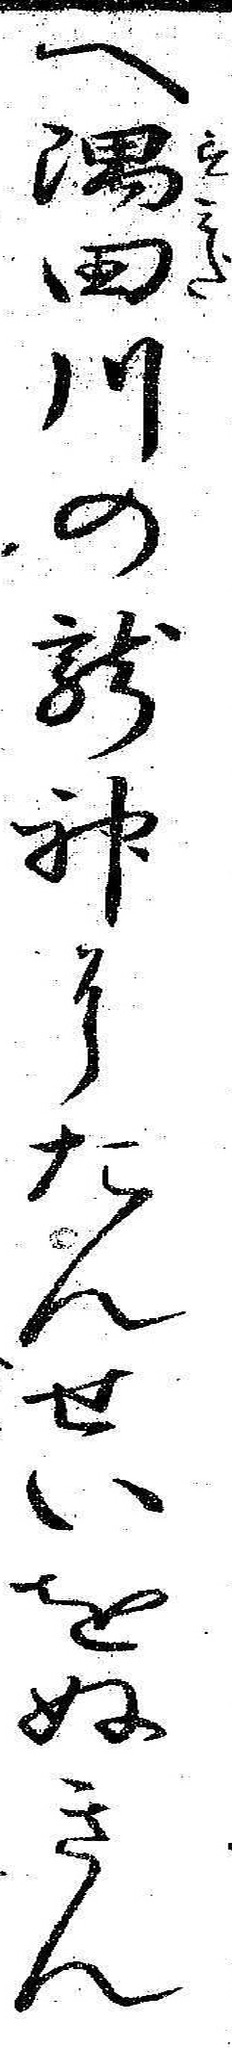へ隅田川の竜神にたんせいをぬきん
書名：根無草後編
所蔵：国文学研究資料館
